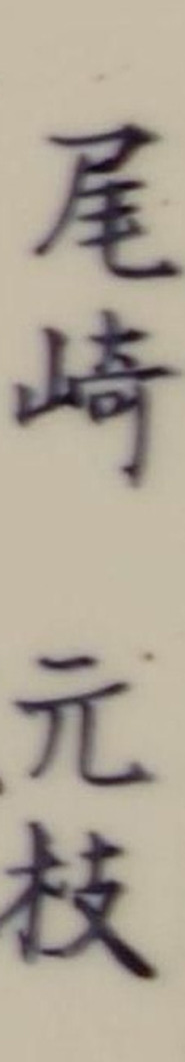尾崎元枝
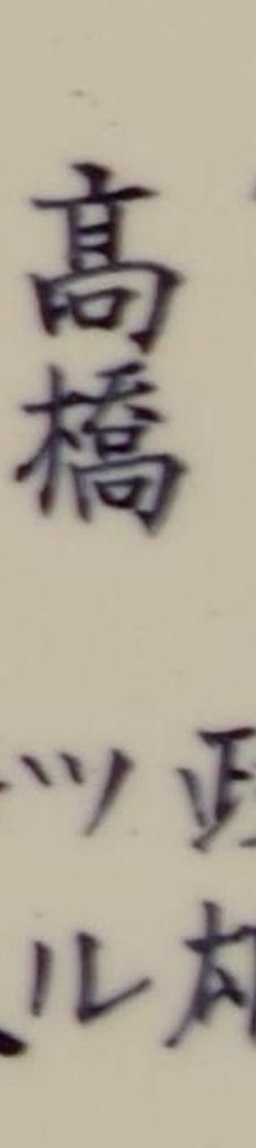高橋ツル
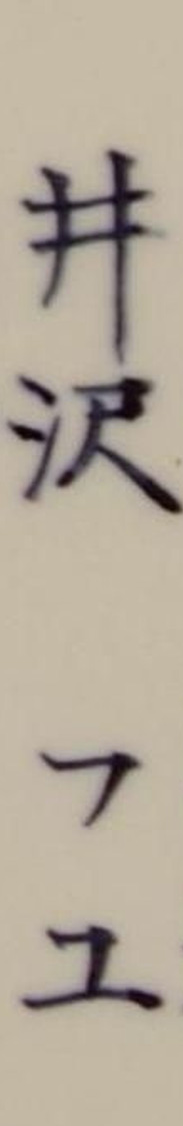井沢フユ
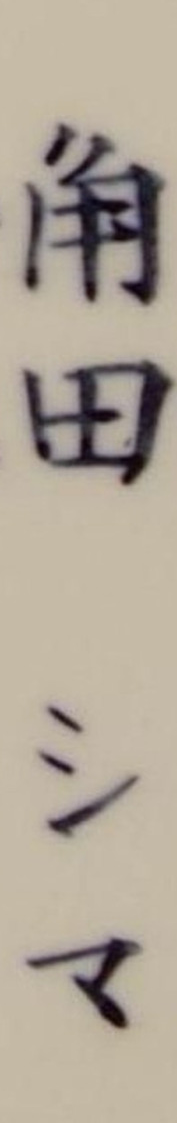角田シマ
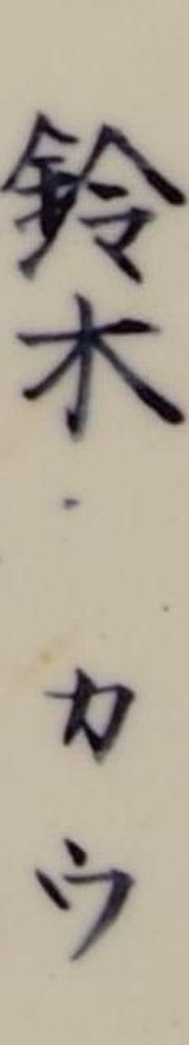鈴木カウ
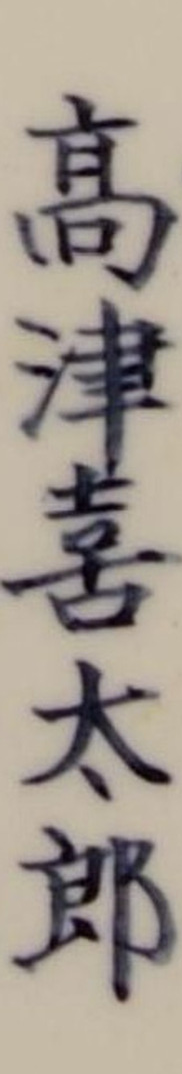高津喜太郎
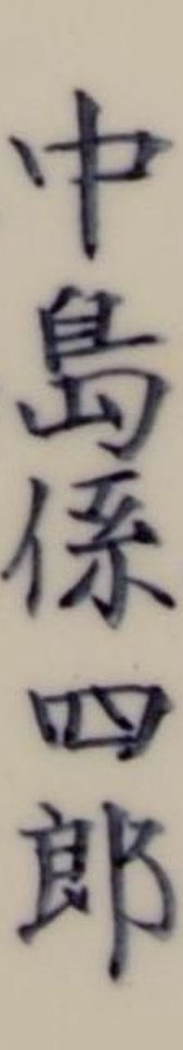中島係四郎
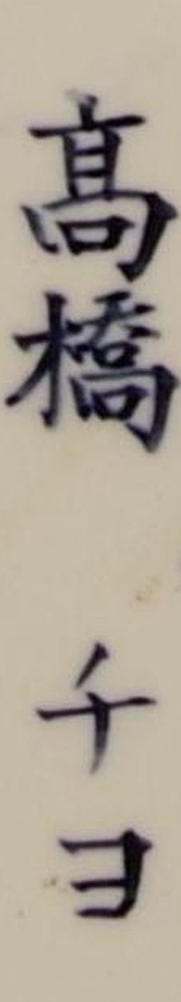高橋チヨ
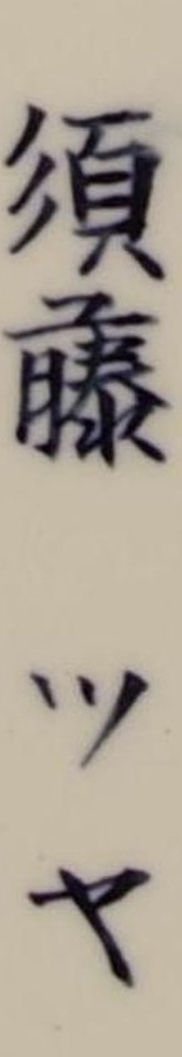須藤ツヤ
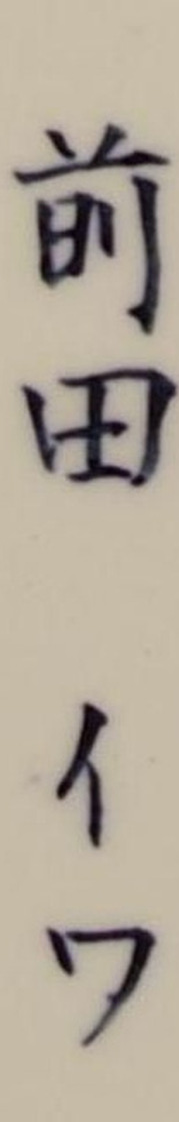前田イワ
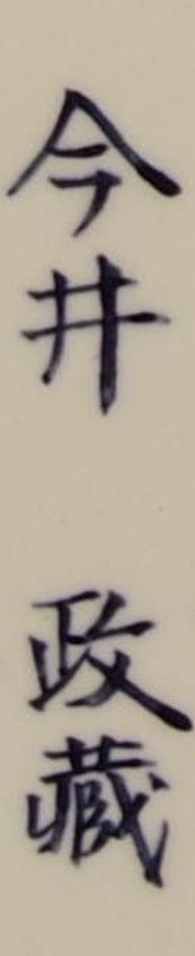今井政蔵
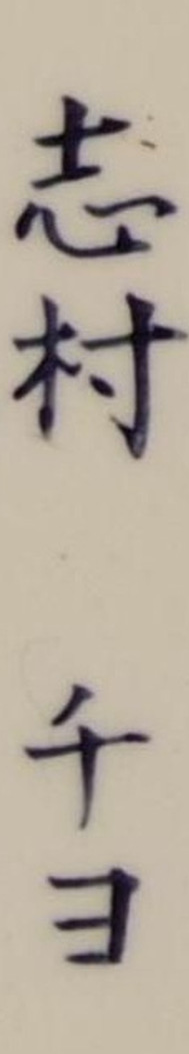志村チヨ
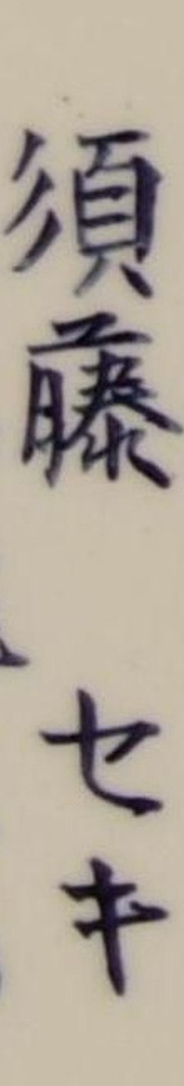須藤セキ
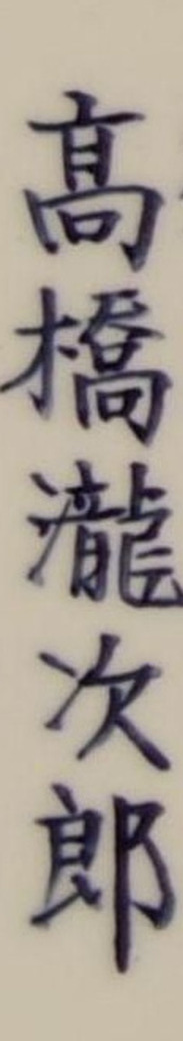高橋瀧次郎

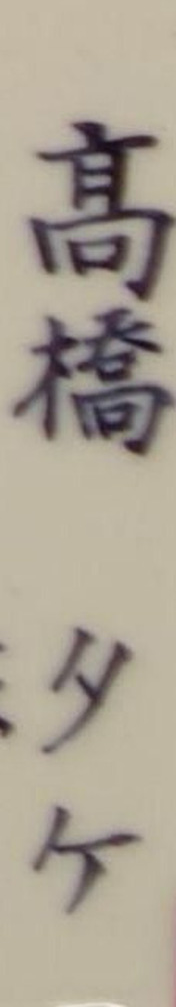高橋夕ケ
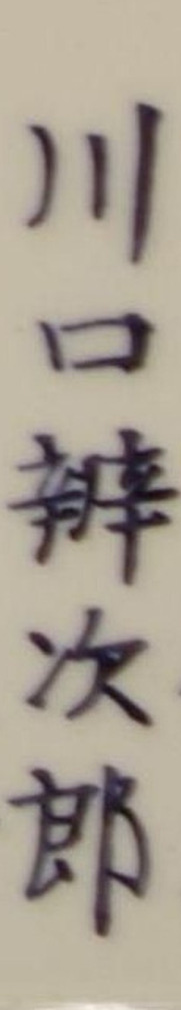川口辨次郎
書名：M~S
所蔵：高野山金剛峯寺
